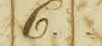6
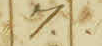7
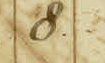8
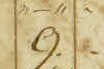9
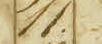11
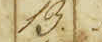13
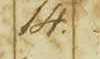14
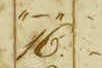16
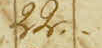22
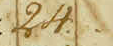24
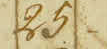25
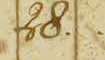28
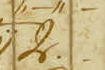2
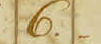6
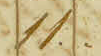11
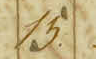15
